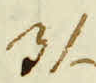31
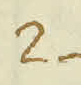2
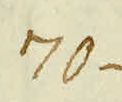70
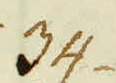34
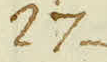27
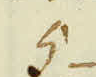5
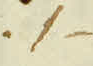1
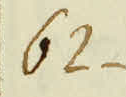62
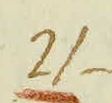21
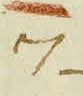7
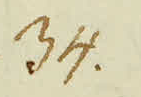34.
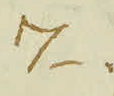7 -
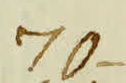70
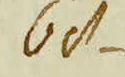68
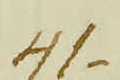41
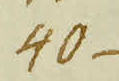40
